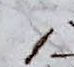1
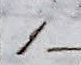1
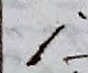1
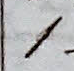1
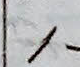1
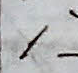1
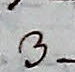3
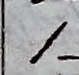1
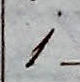1
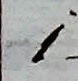1
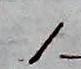1
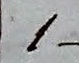1
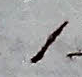1
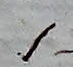1
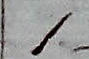1
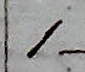1
